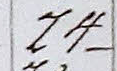24
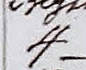4
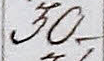30
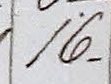16
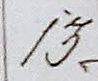13
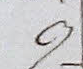9
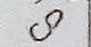8
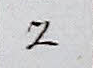2
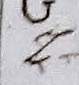2
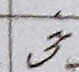3
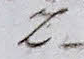2
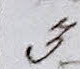3
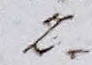2
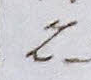2
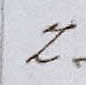2
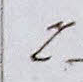2
